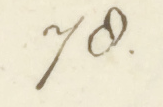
78.
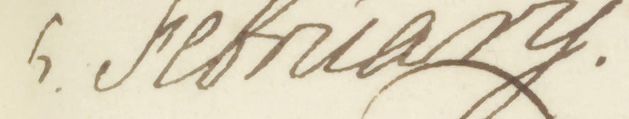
1. Februarij.
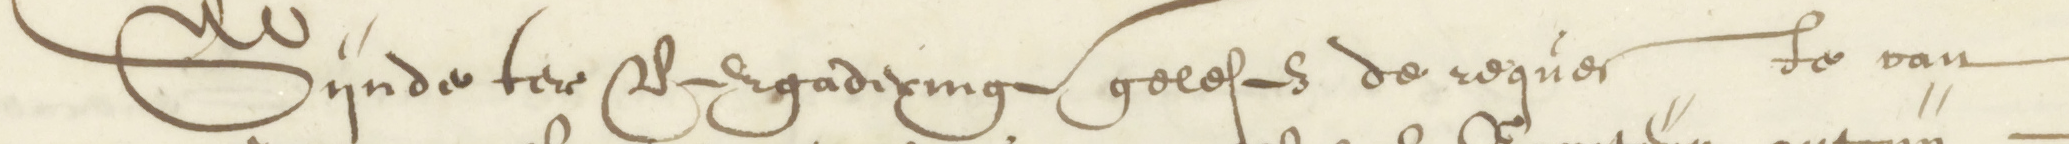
Sijnde ter Vergaderinge gelesen de requeste van
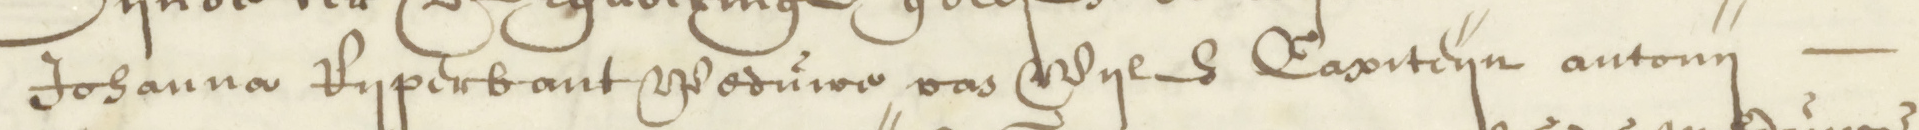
Johanna Ryperbant Weduwe van Wylen Capiteijn antonij —
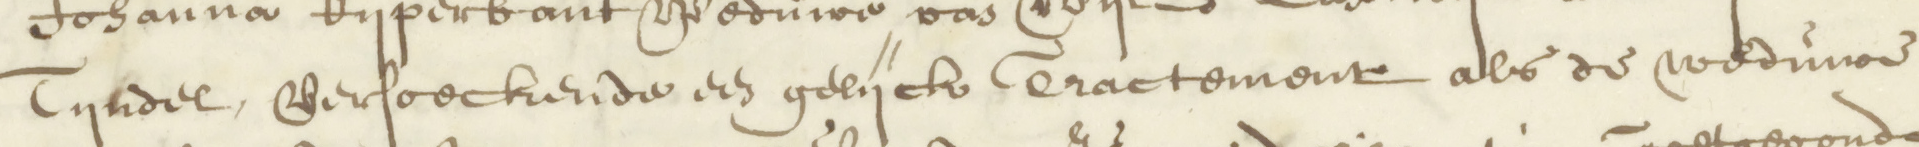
Tyndel, Versoeckende een gelijckTractement als de weduwe
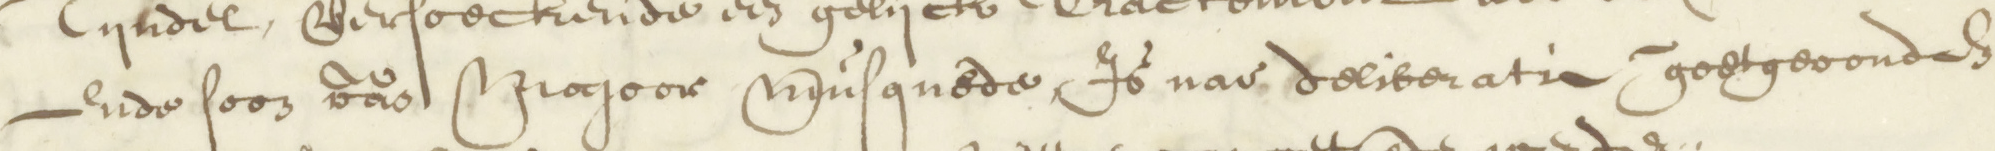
ende soon van Majoor Musquede. Is nae deliberatie goetgevonden
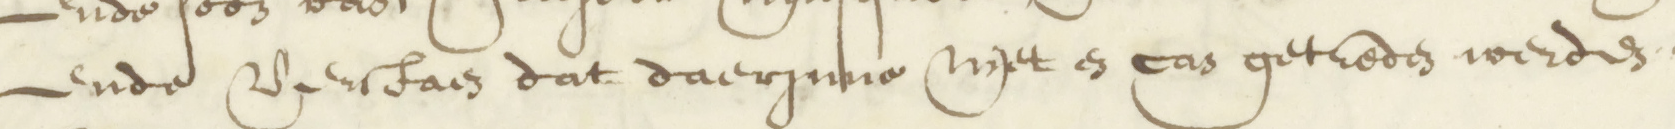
ende Verstaen dat daerinne niet en can getreden werden.
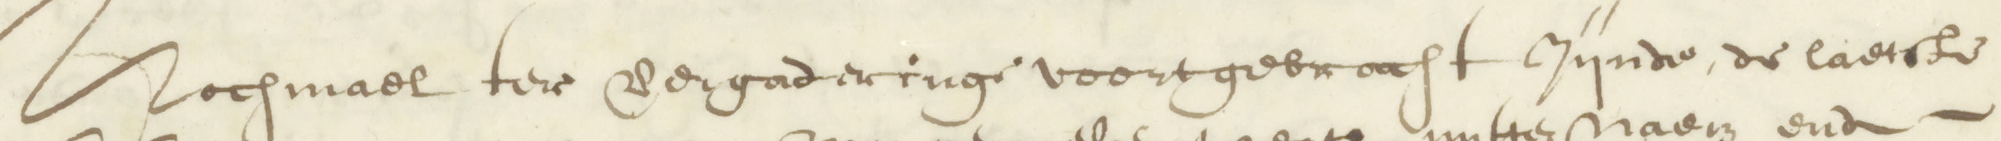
Nochmael ter Vergaderinge voortgebracht Zijnde, de laetste
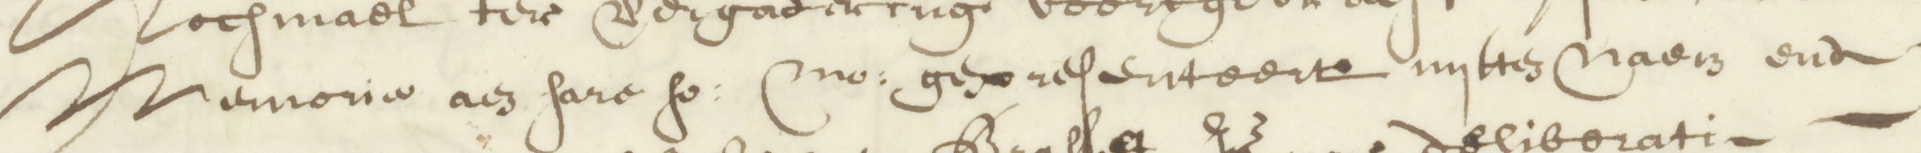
Memorie aen hare ho:Mo: gepresenteert uytten Naem ende
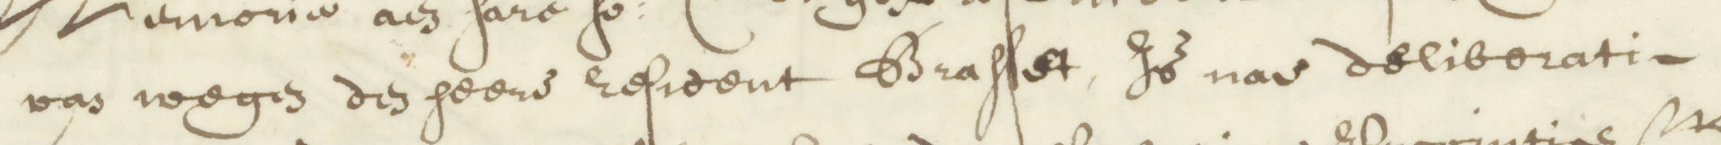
van wegen den heere resident Brasset. Is nae deliberatie
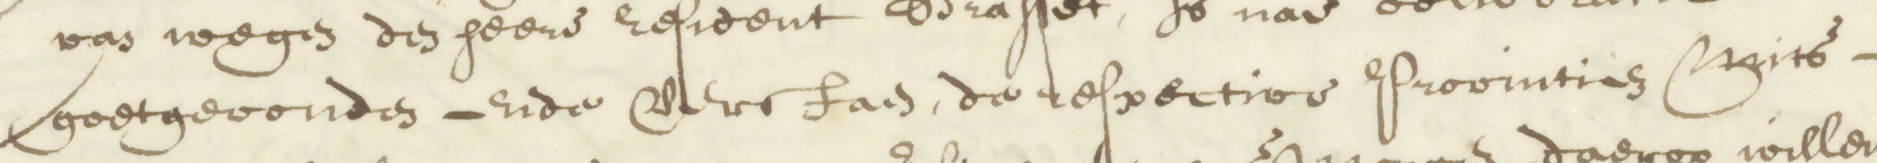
goetgevonden ende Verstaen, de respective Provintien Mits
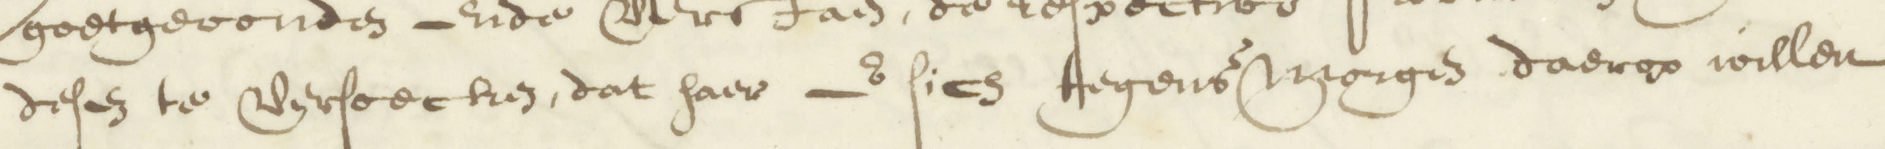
desen te Versoecken, dat haer E sich tegens Morgen daerop willen
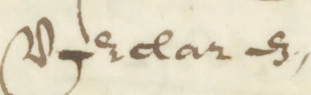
Verclaren.
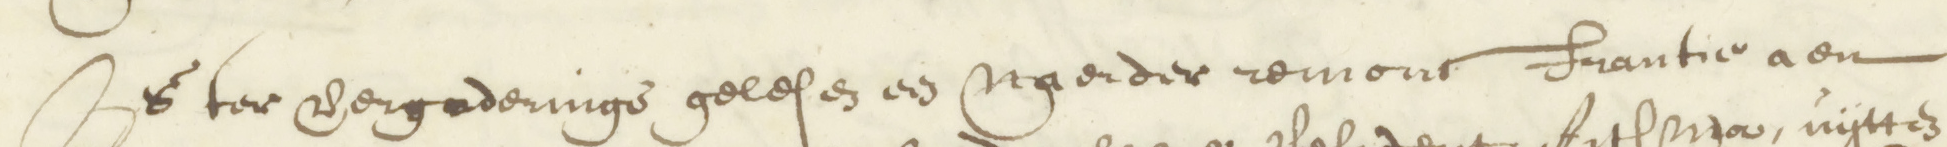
Is ter Vergaderinge gelesen een naerder remonstrantie aen
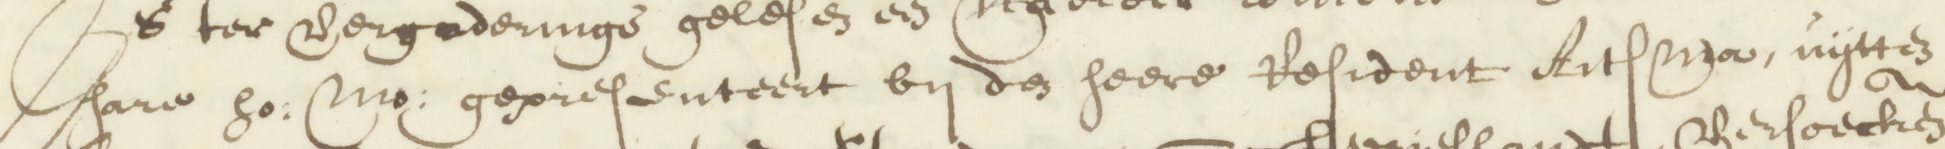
hare ho:Mo: gepresenteert by den heere Resident Aitsma, uijtten
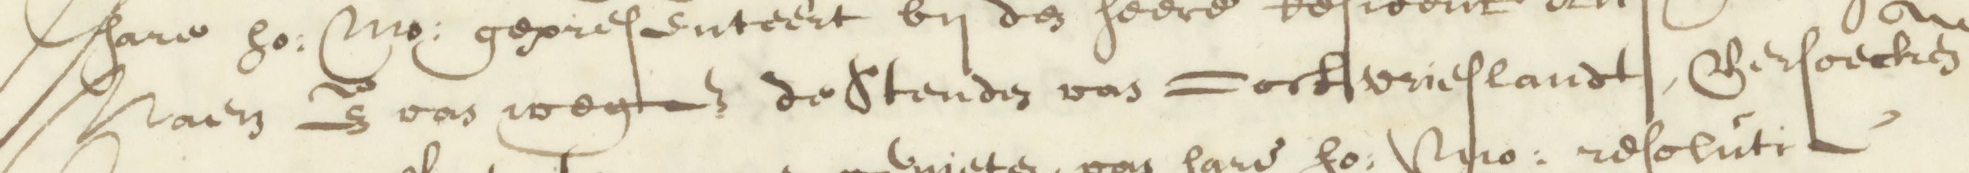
Naem en van wegen de Stenden van Oostvrieslandt, Versoecken
